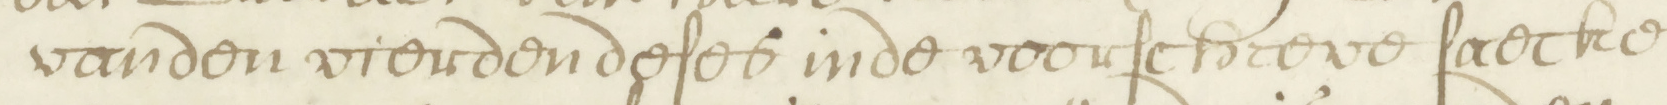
vanden vierden deses inde voorschreve saecke
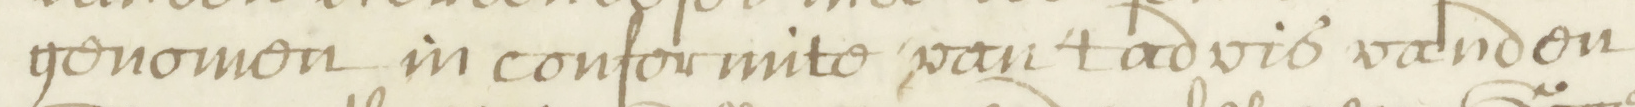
genomen in conformité van 't advis vanden
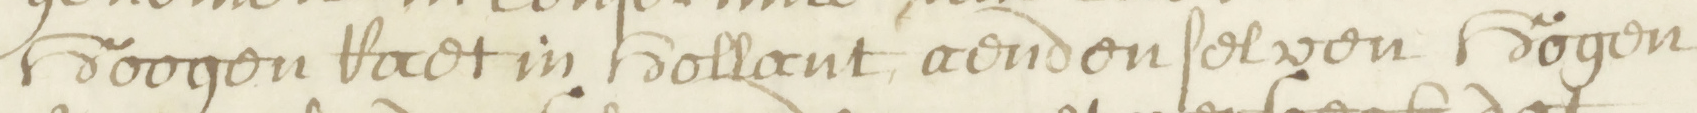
Hoogen Raet in Hollant, aenden selven Hogen
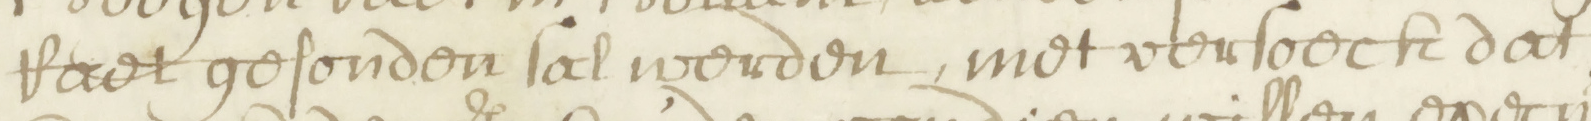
Raet gesonden sal werden, met versoeck dat
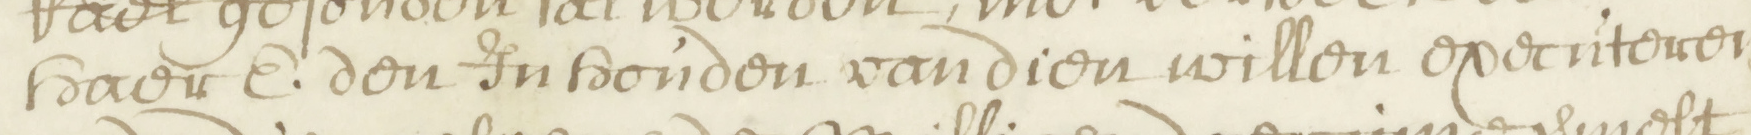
haer E. den Inhouden van dien willen executeren
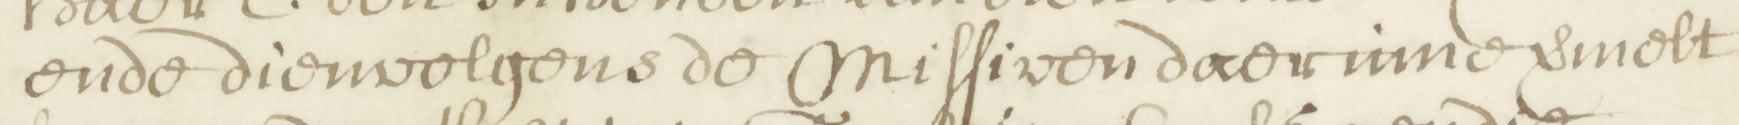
ende dienvolgens de Missiven daerinne vmelt
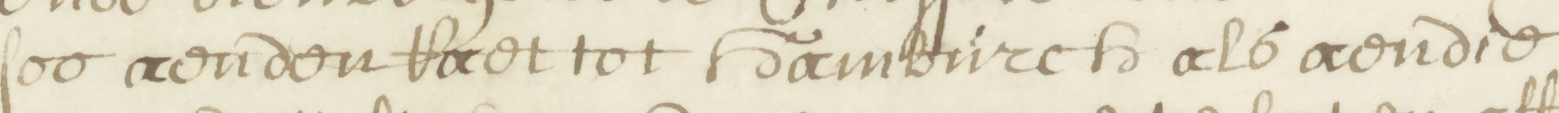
soo aenden Raet tot Hamburch als aendie
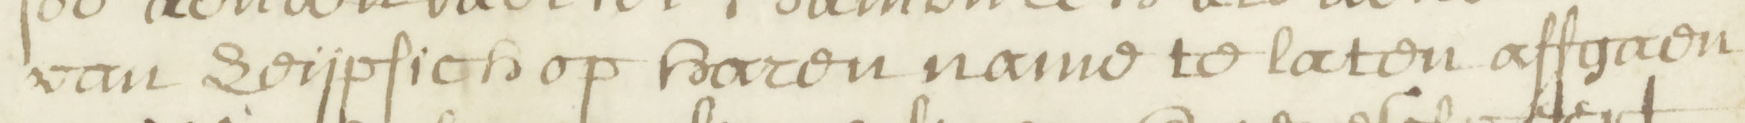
van Leijpsich op haren name te laten affgaen
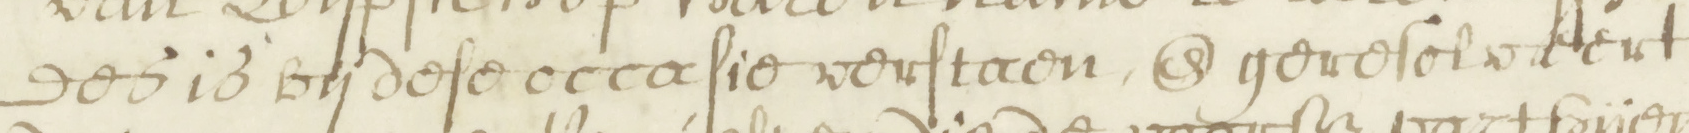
Des is bij dese occasie verstaen, & geresolveert
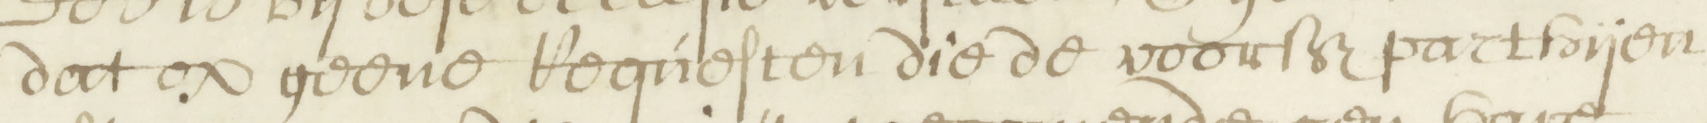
dat op geene Requesten die de voors parthijen
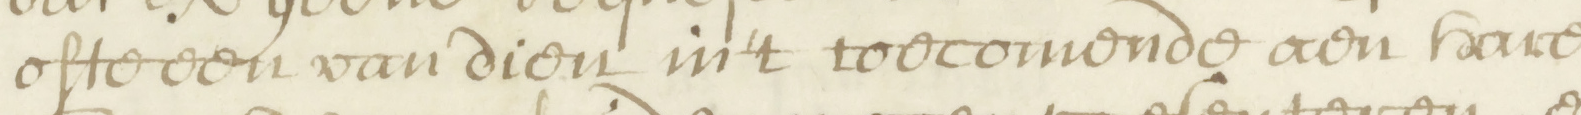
ofte een van dien in‛t toecomende aen hare
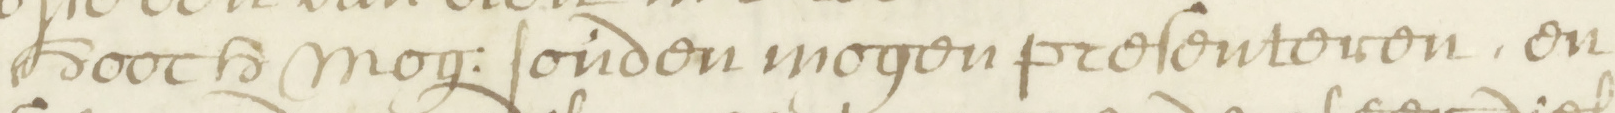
Hooch Mog: souden mogen presenteren, en
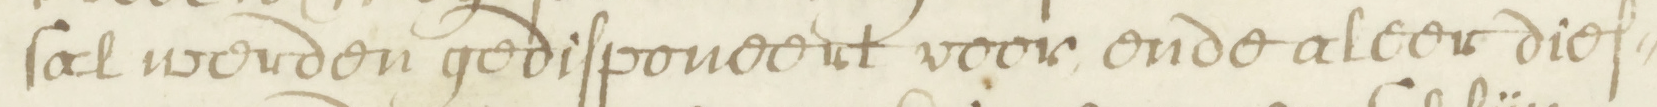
sal werden gedisponeert voor ende aleer dies„
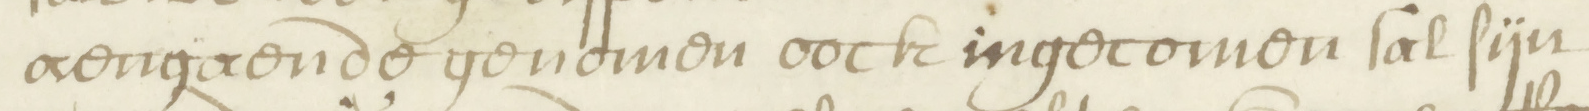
aengaende genomen oock ingecomen sal sijn
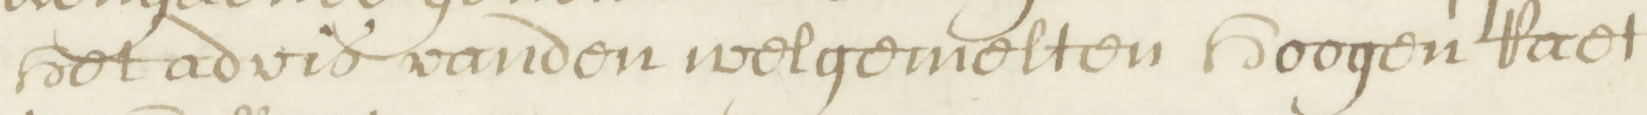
het advis vanden welgemelten Hoogen Raet
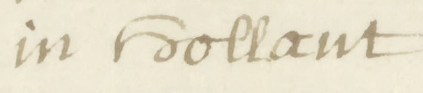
in Hollant.
